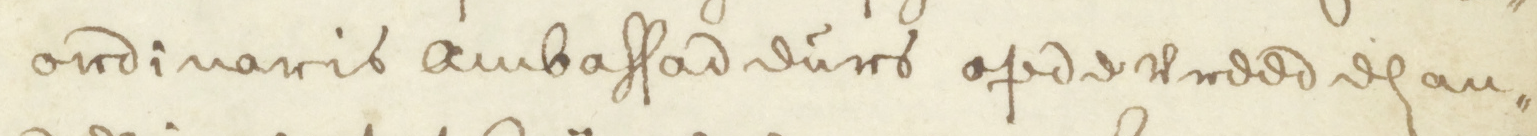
ordinaris Ambassadeurs opde Vreedehan„
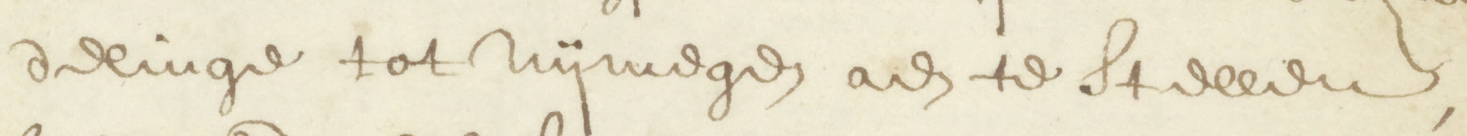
delinge tot Nijmegen aen te stellen,
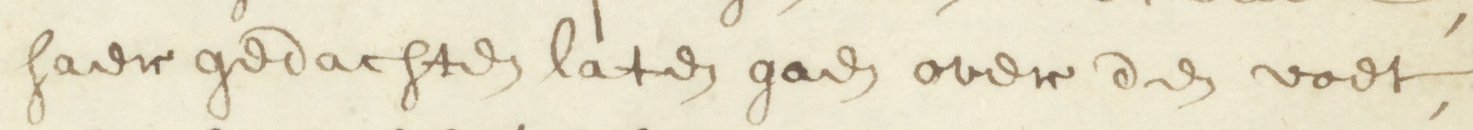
haer gedachten laten gaen over den voet,
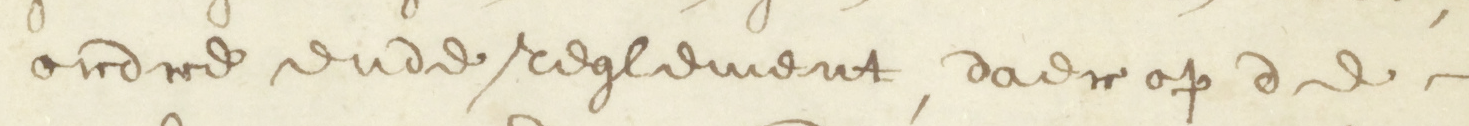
ordre ende reglement, daer op de
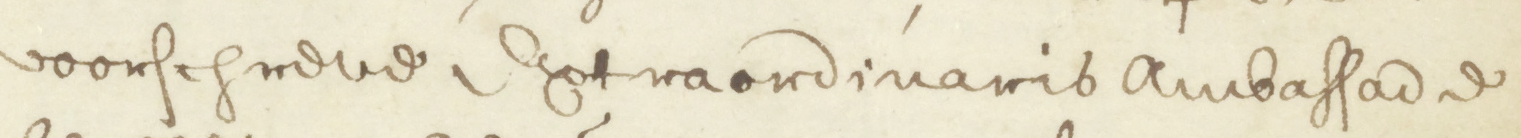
voorschreve Extraordinaris Ambassade
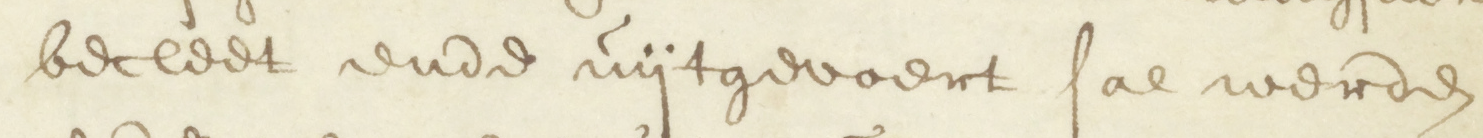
becleet ende uijtgevoert sal werden,
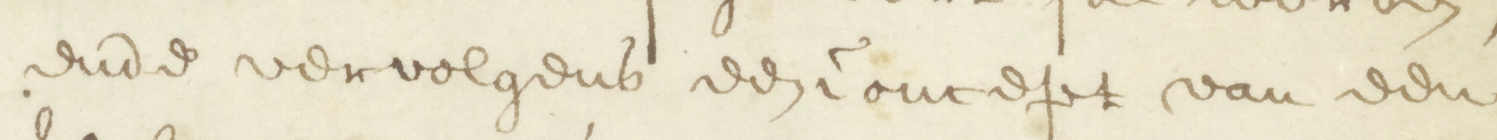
ende vervolgens een Concept van een
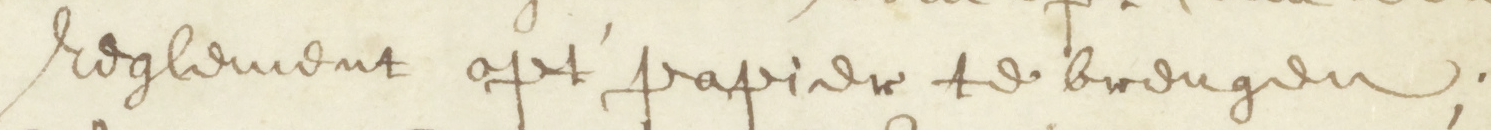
reglement opt‛ papier te brengen;
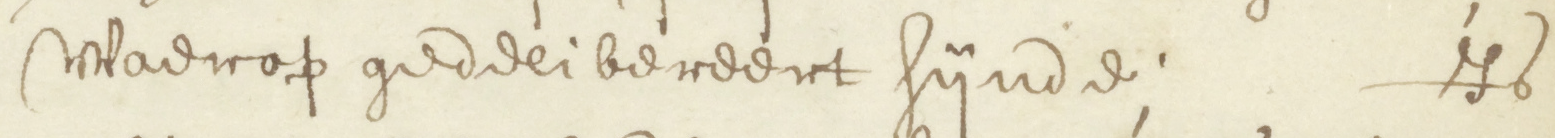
Waerop gedelibereert sijnde: Is
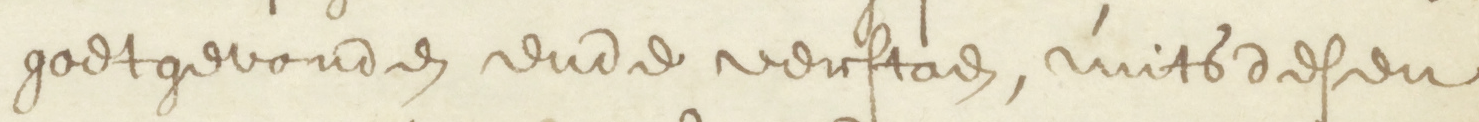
goetgevonden ende verstaen, mitsdesen
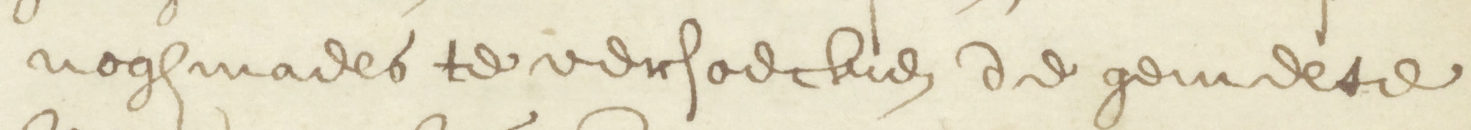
noghmaels te versoecken de gemelte
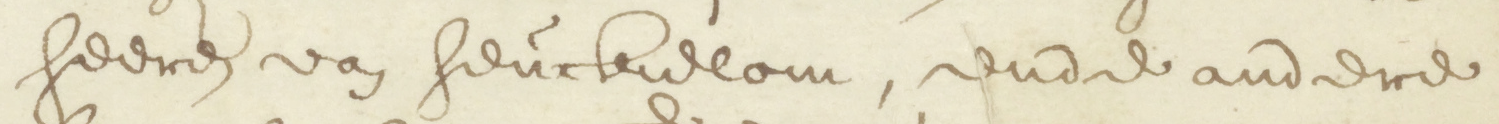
heeren van heuckelom, ende andere
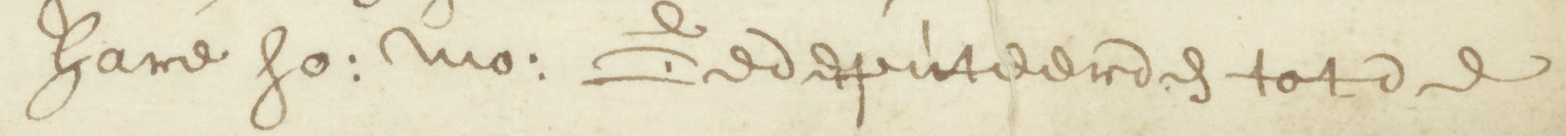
hare ho:Mo: Gedeputeerden tot de
